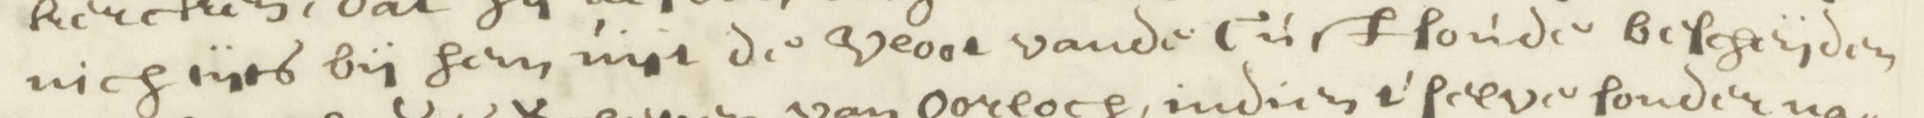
nich tijts bij hem uijt de Vloot vande Cust soude bescheijden
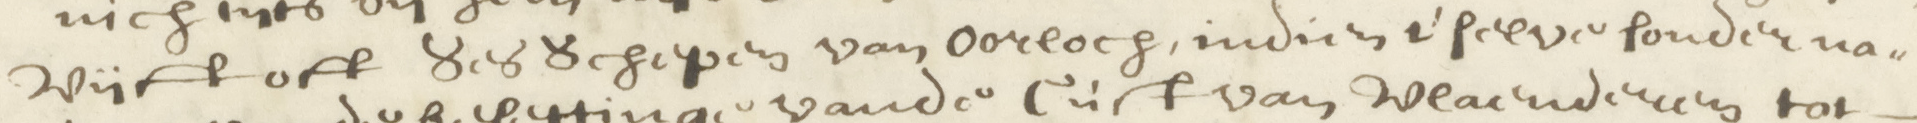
Vijff off ses schepen van oorloch, indien t'selve sonder na,,
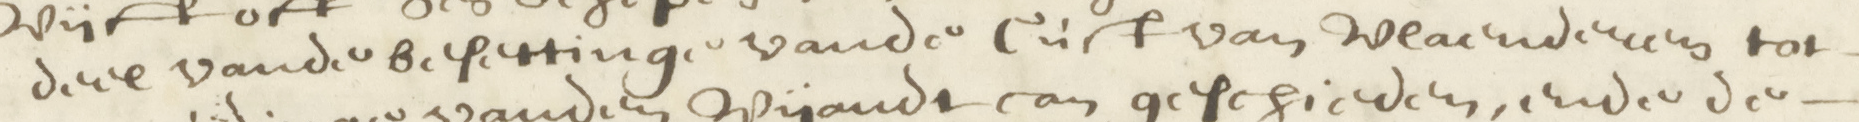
deel vande besettinge vande Cust van Vlaenderen tot
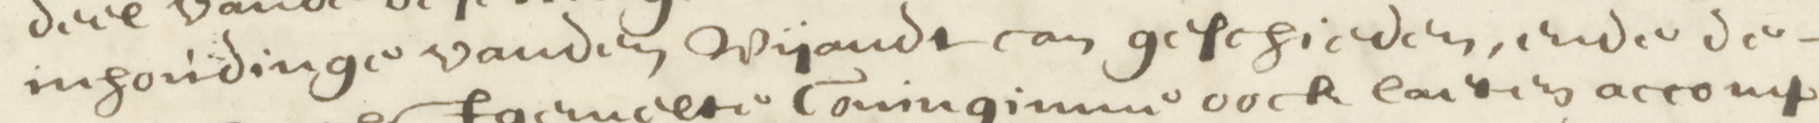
inhoudinge vanden Vijandt can geschieden, ende de
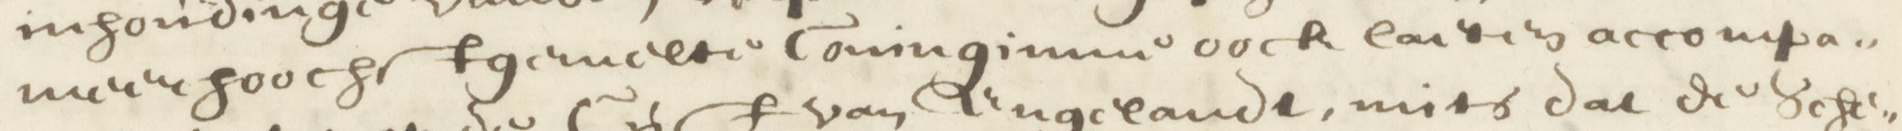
meer hoochstgemelte Coninginne oock laeten accompa,,
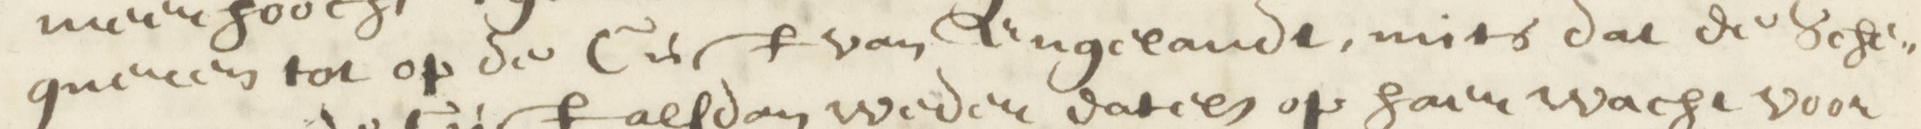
gneren tot op de Cust van Engelandt, mits dat de sche,,
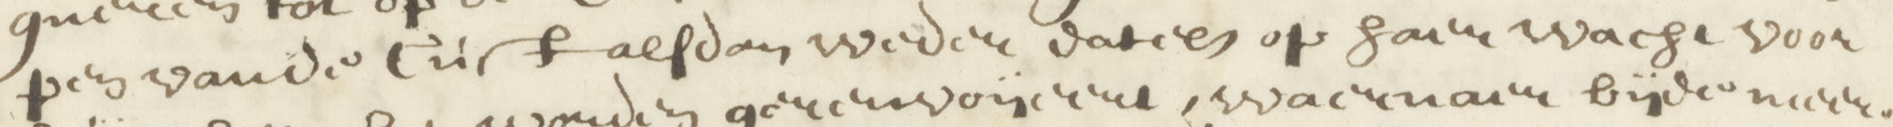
pen vande Cust alsdan weder datel op haer wacht voor
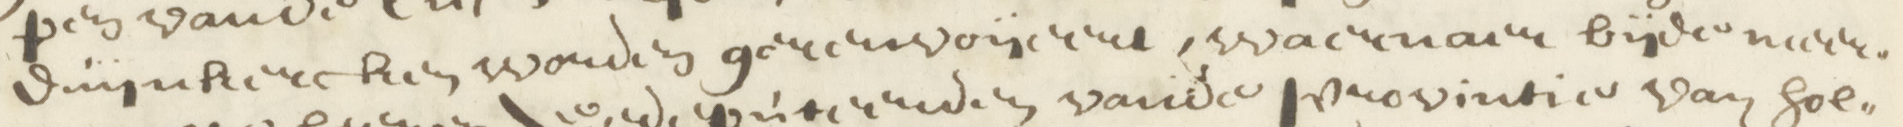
Duijnkercken worden gerenvoijeert, waernaer bijde meer,,
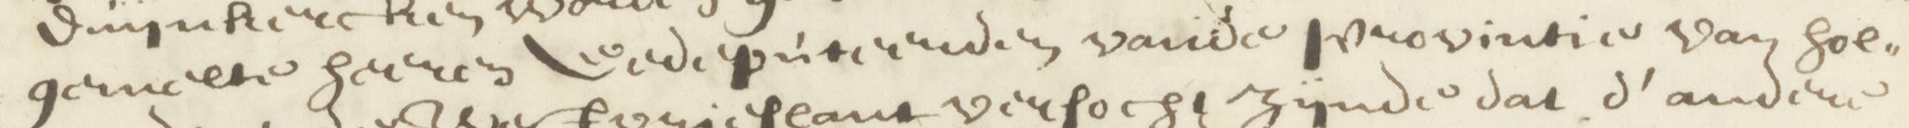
gemelte heeren Gedeputeerden vande provintie van hol,,
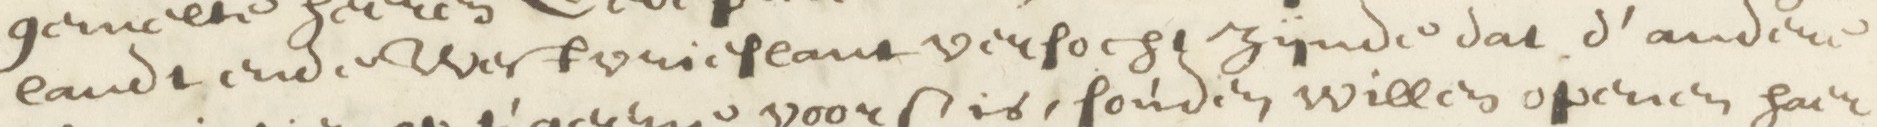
landt ende Westvrieslant versocht zijnde dat d'andere
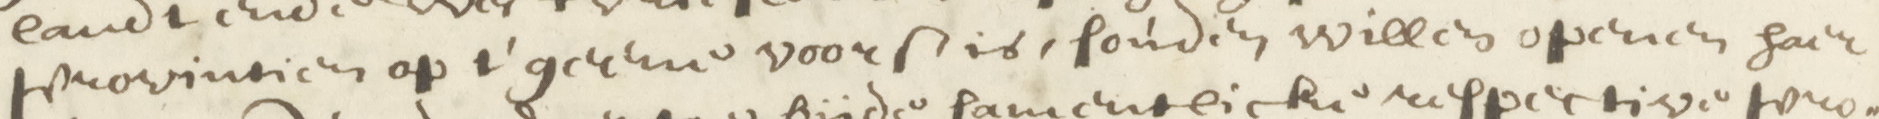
provintien op t'geene voors. is, souden willen openen haer
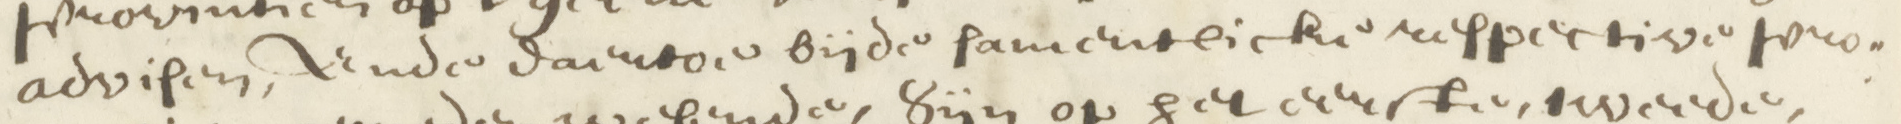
advisen. Ende daertoe bijde samentlicke respective pro,,
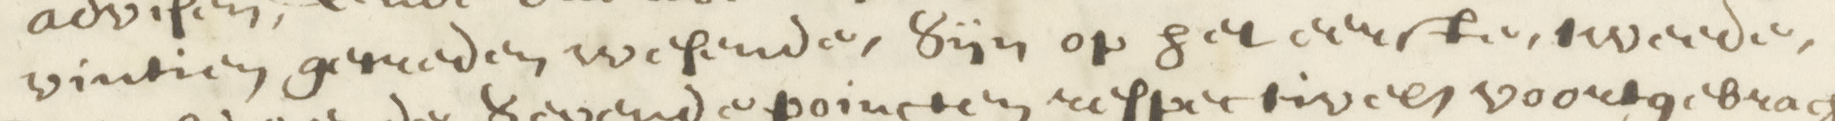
vintien getreden wesende, sijn op het eerste, tweede,
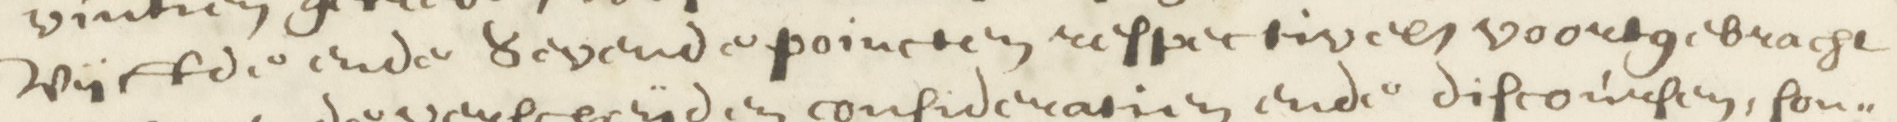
Vijffde ende sevende poincten respectivel voortgebracht
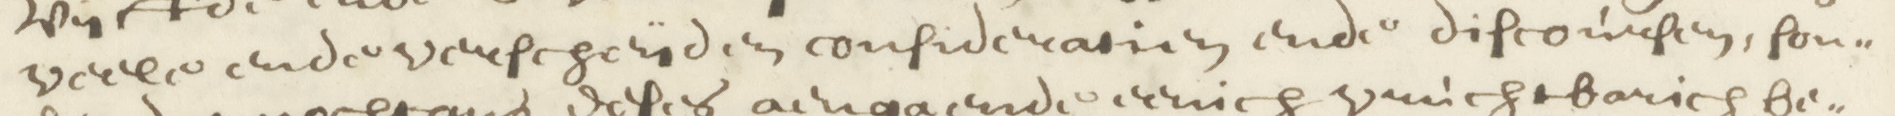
veele ende verscheijden consideratien ende discoursen, son,,
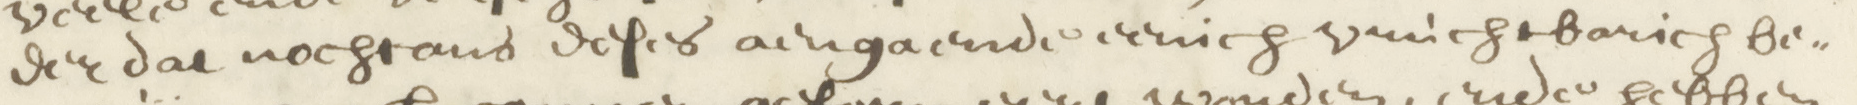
der dat nochtans deses aengaende eenich vruchtbarich be,,
